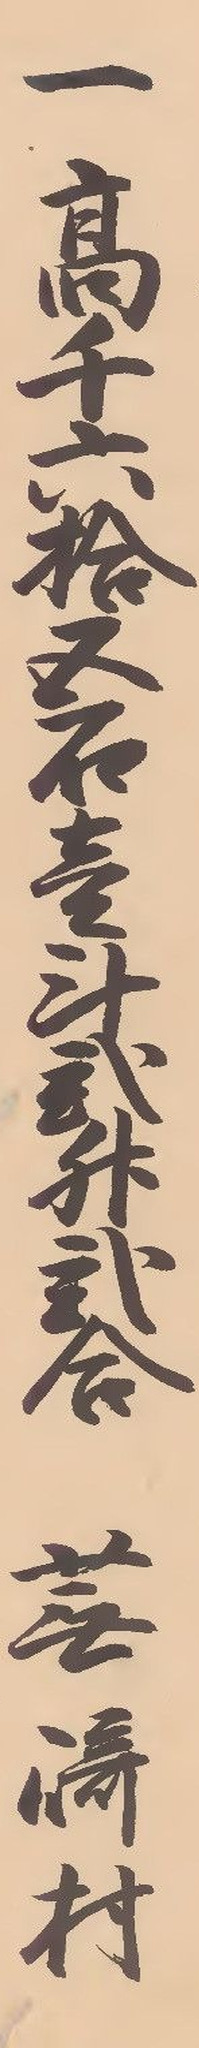一高千六拾五石壱斗弐升弐合蕪崎村

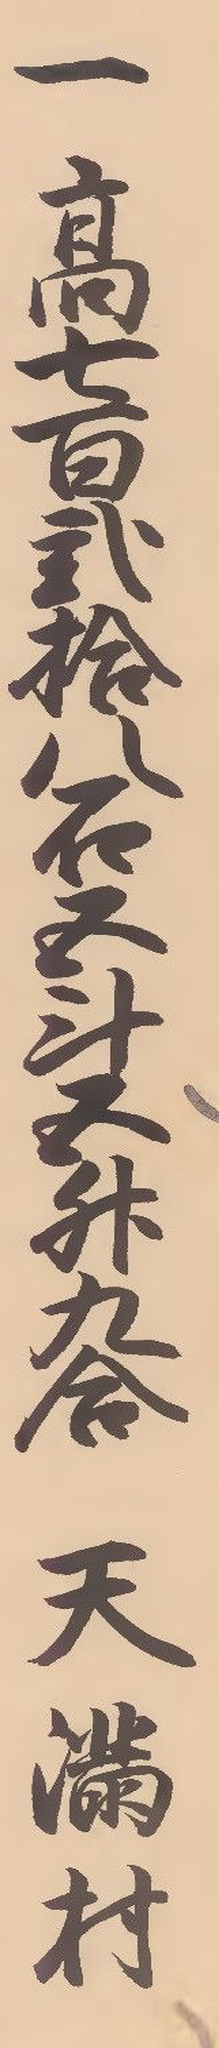一高七百弐拾八石五斗五升九合天満村
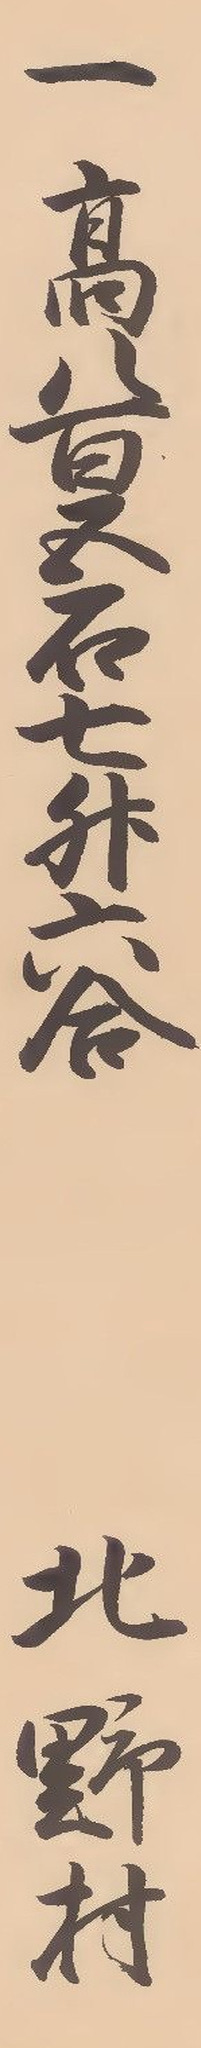一高八百五石七升六合北野村
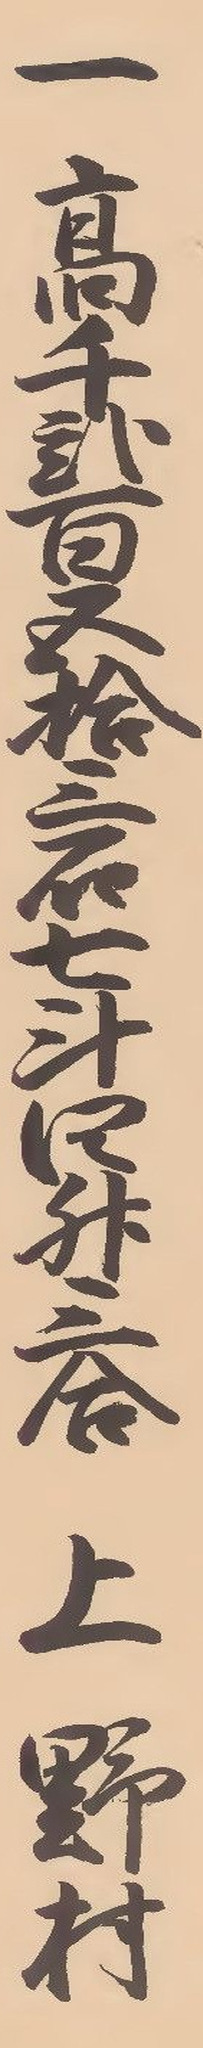一高千弐百五拾三石七斗四升三合上野村
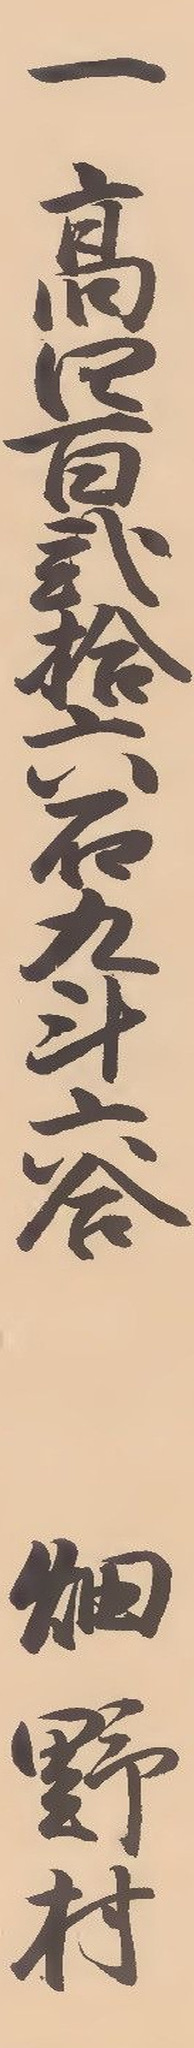一高四百弐拾六石九斗六合畑野村
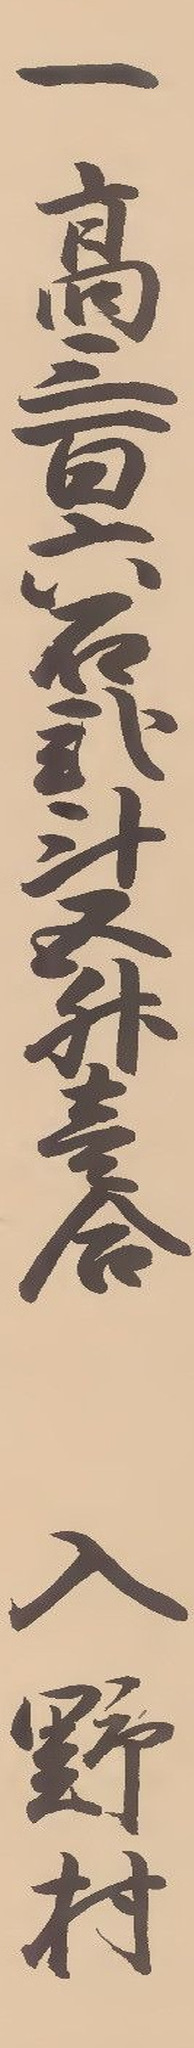一高三百六石弐斗五升壱合入野村
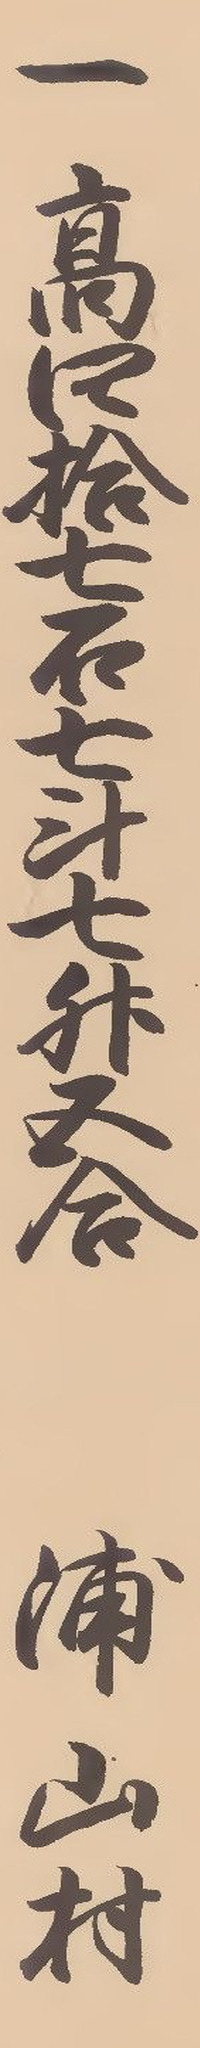一高四拾七石七斗七升五合浦山村
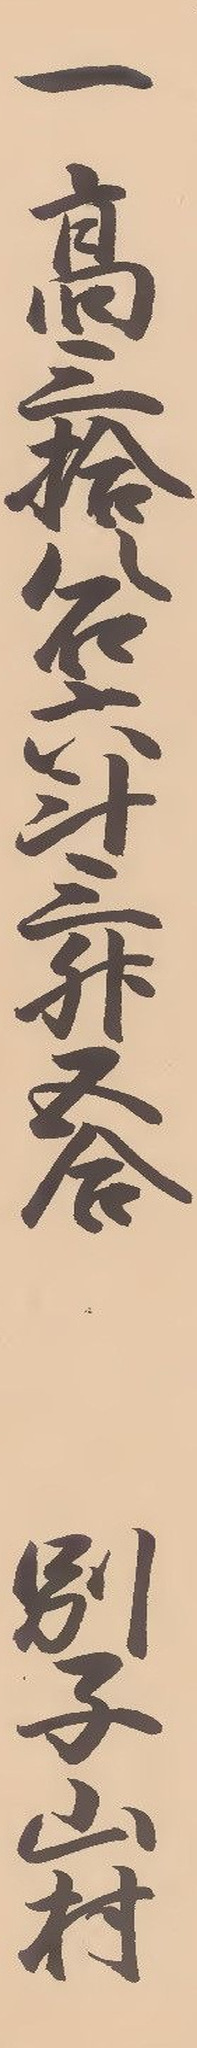一高三拾八石六斗三升五合別子山村
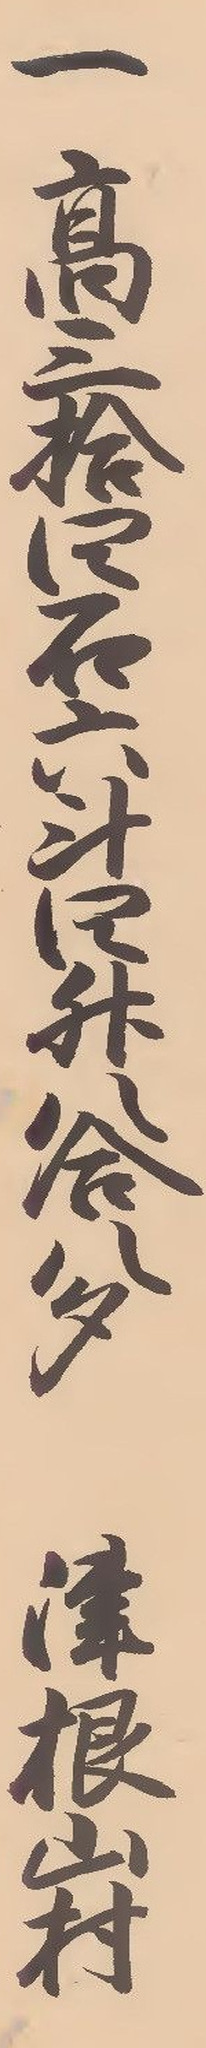一高三拾四石六斗四升八合八勺津根山村

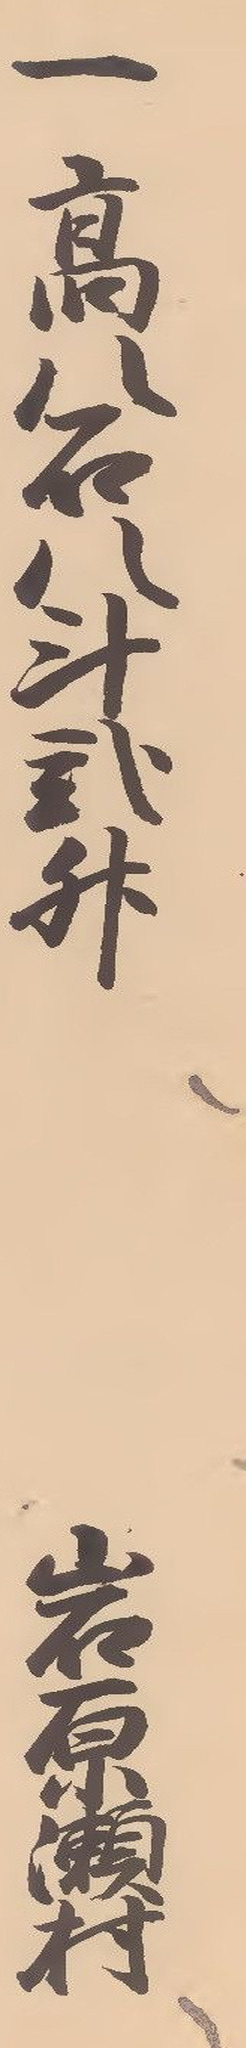一高八石八斗弐升岩原瀬村
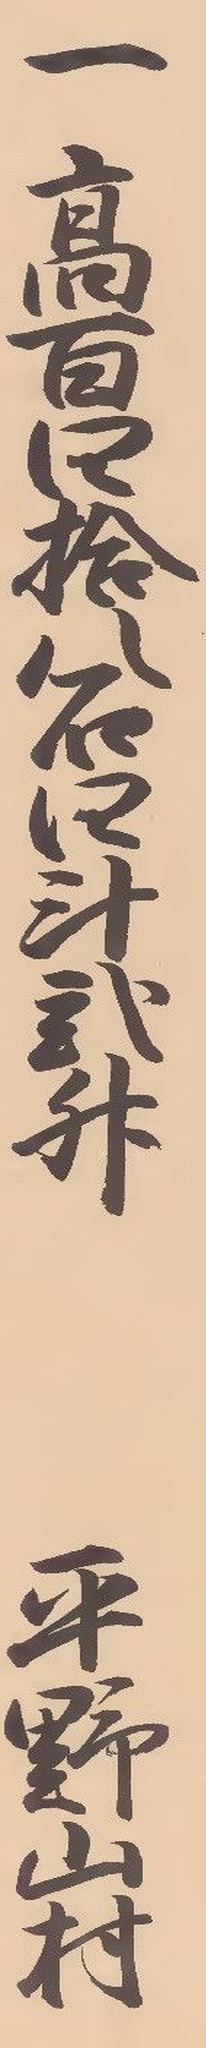一高百四拾八石四斗弐升平野山村
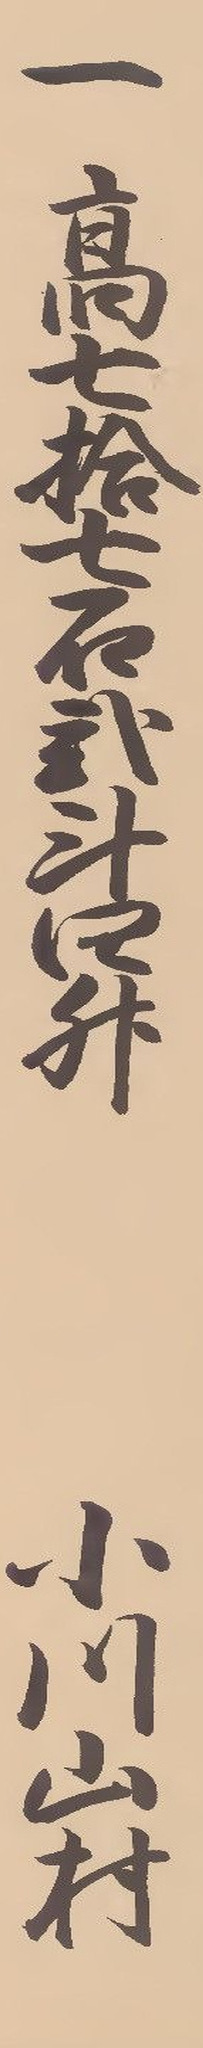一高七拾七石弐斗四升小川山村
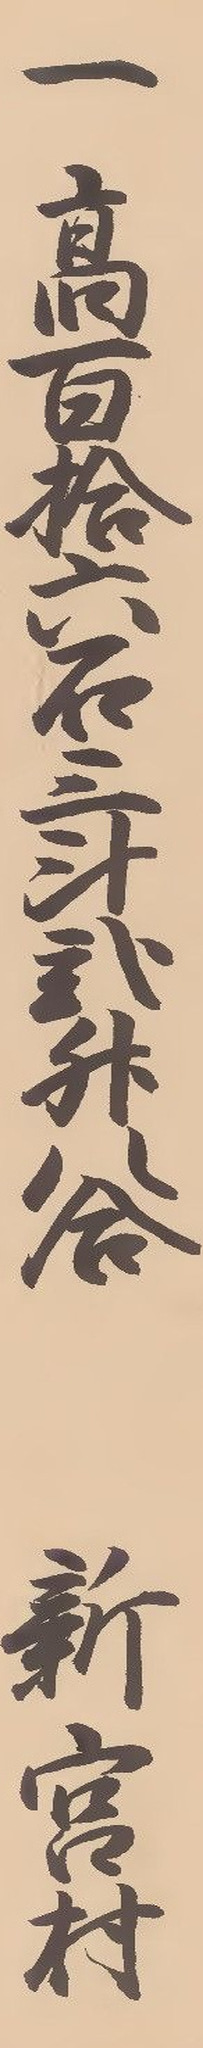一高百拾六石三斗弐升八合新宮村
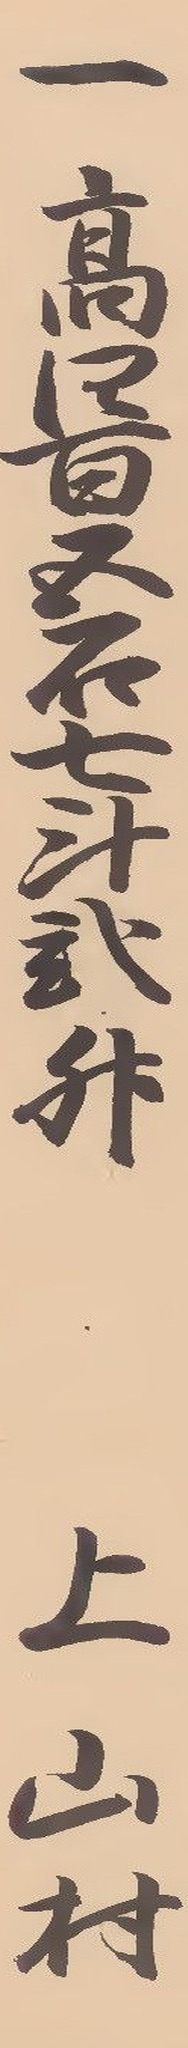一高四百五石七斗弐升上山村
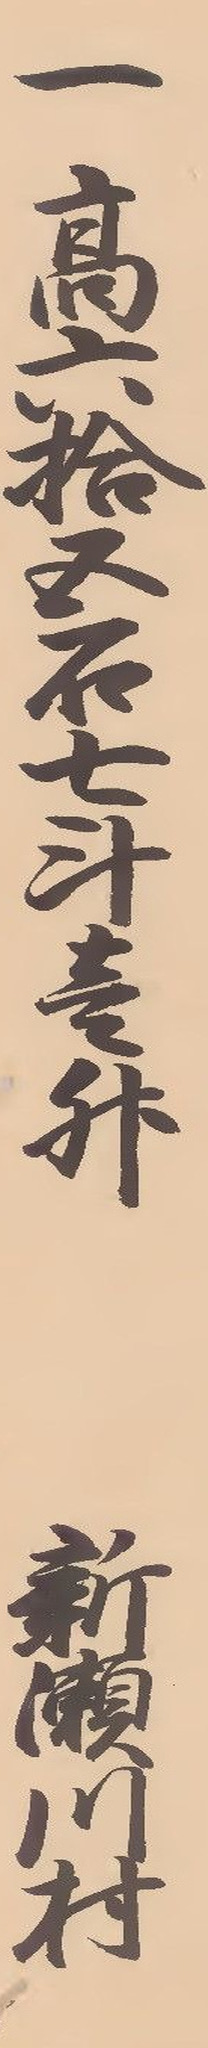一高六拾五石七斗壱升新瀬川村

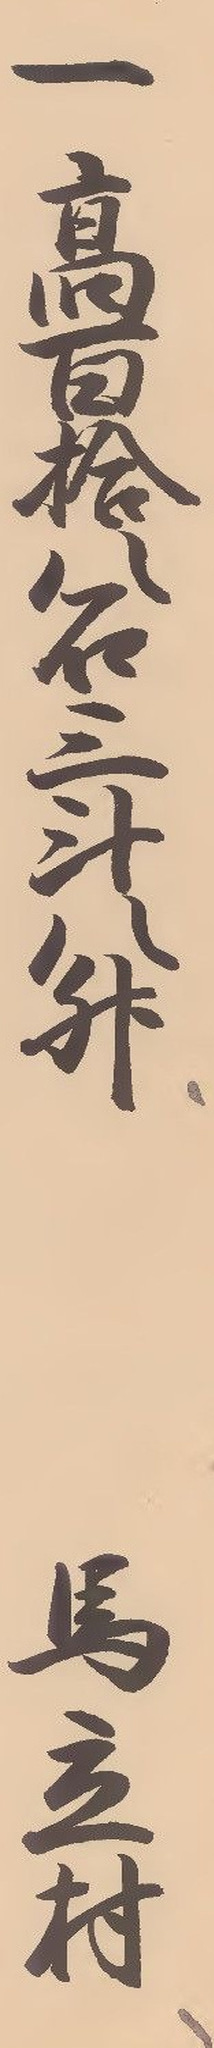一高百拾八石三斗八升馬立村
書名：伊予国郷帳
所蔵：国立公文書館 National Archives of Japan
